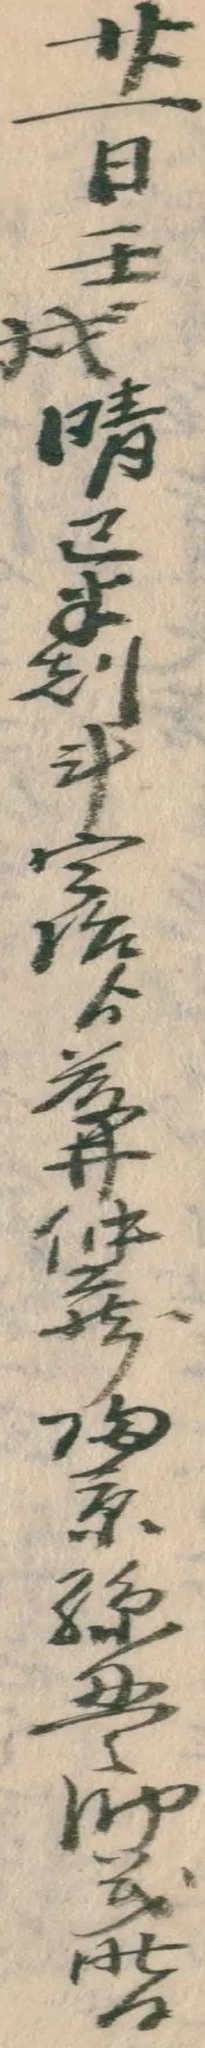廿一日壬戌晴巳半刻斗宇治ゟ藤井仲蔵帰京孫丑之助義昨日
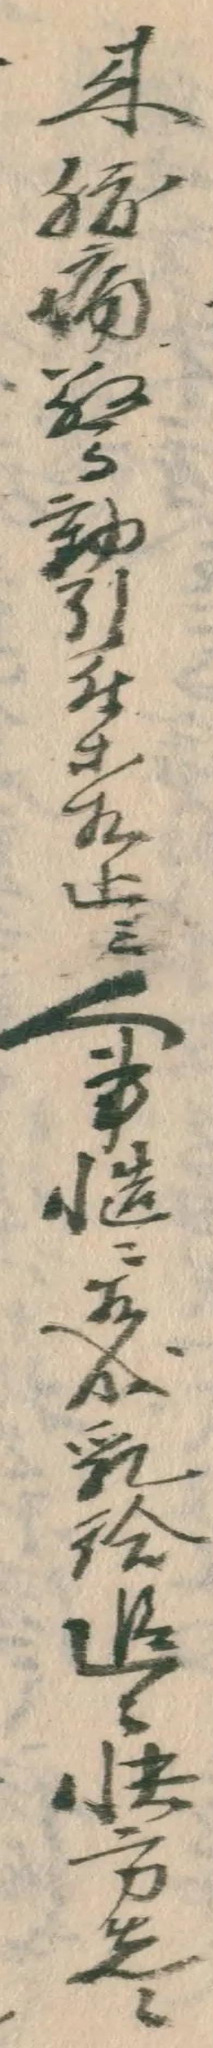来腹痛驚動引付等相止ミ人事慥ニ相成乳給追々快方先々
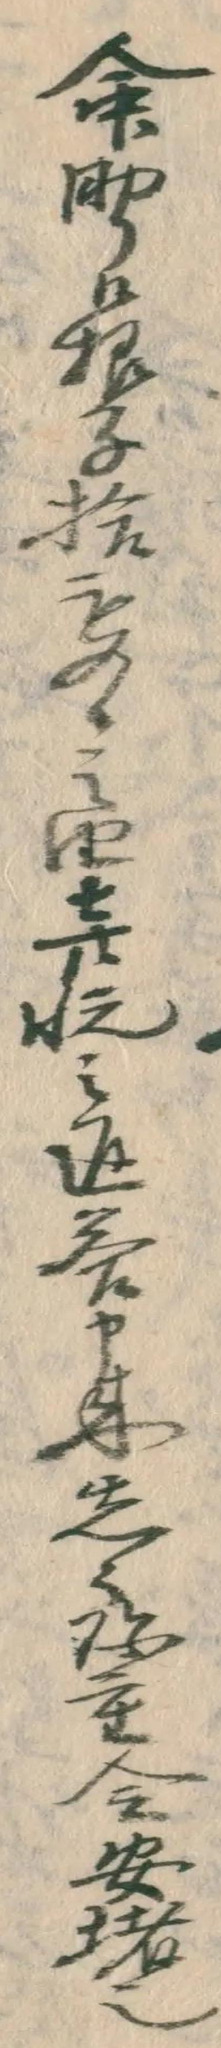命助り候様子拾もの日之由喜悦之返答申来先々珍重会安堵也
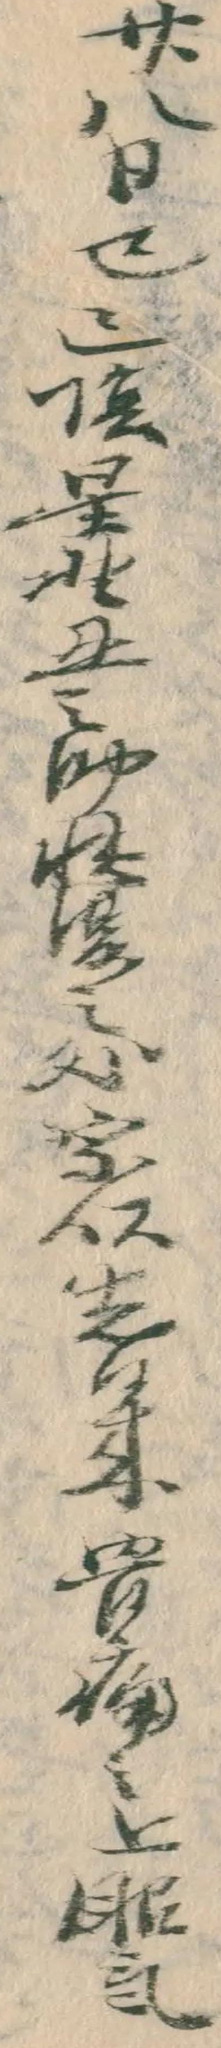廿八日己巳刻陰星野丑之助快復之処宗以先日来骨痛之上眼気
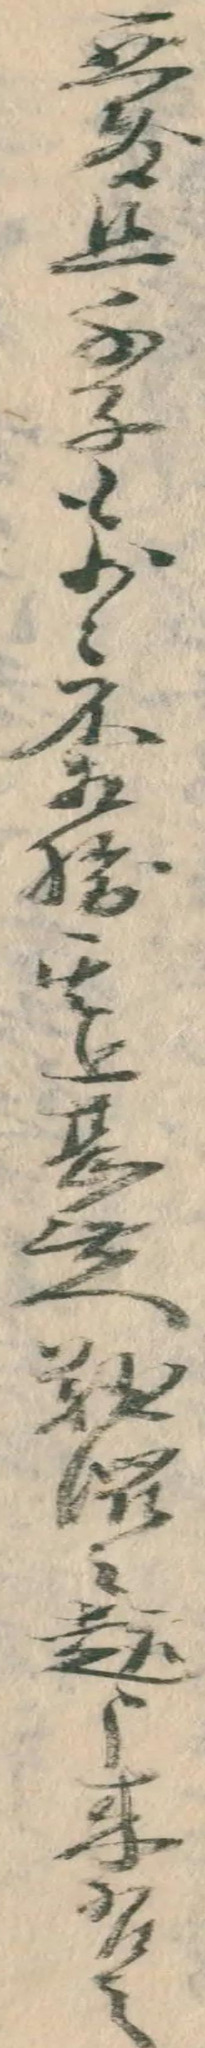悪敷且千子も少々不相勝其上甚無人難渋之趣申来有之
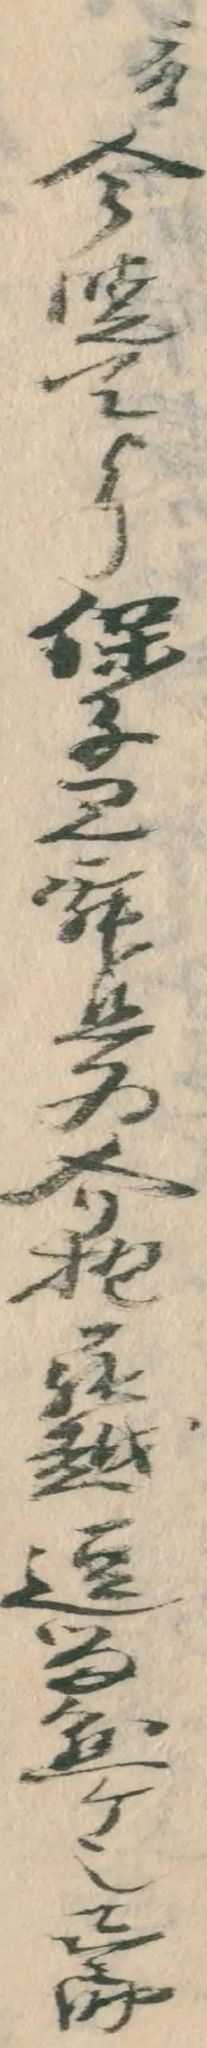ニ而今暁天より保子見舞且為介抱罷越逗留懸ケ之已即
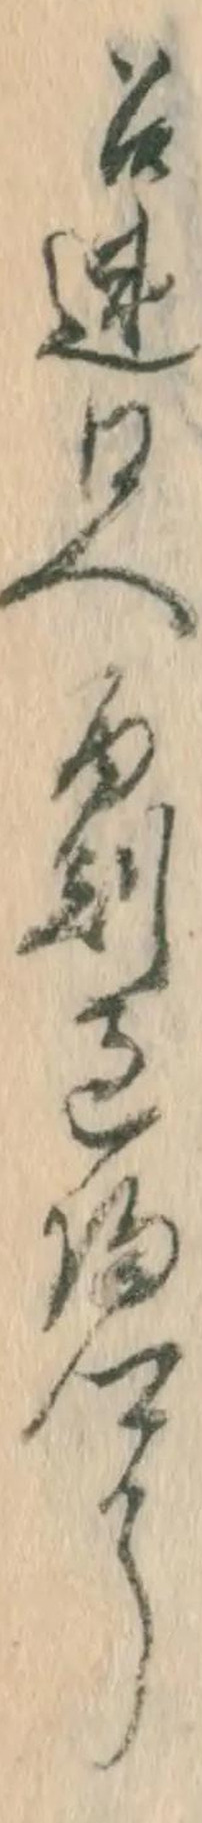召連日人酉刻過帰郷了

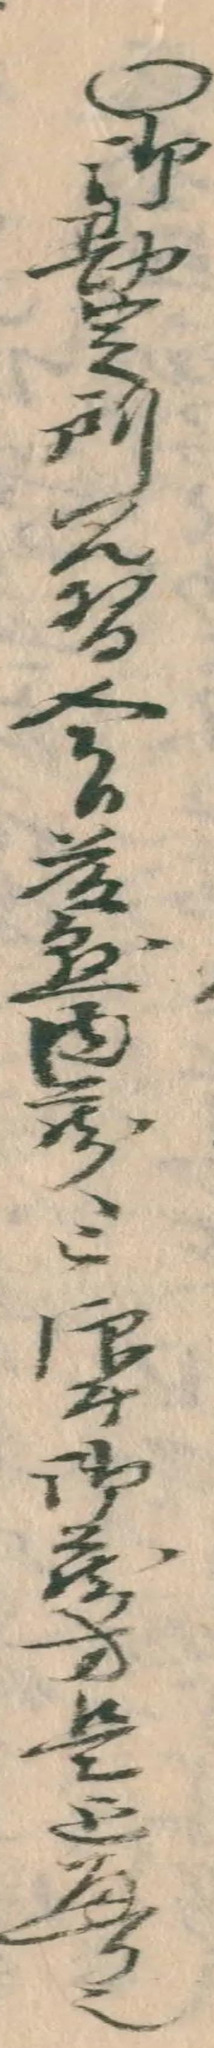○御勘定所見習今日藤懸内蔵へ被仰付御蔵方是迄通り也
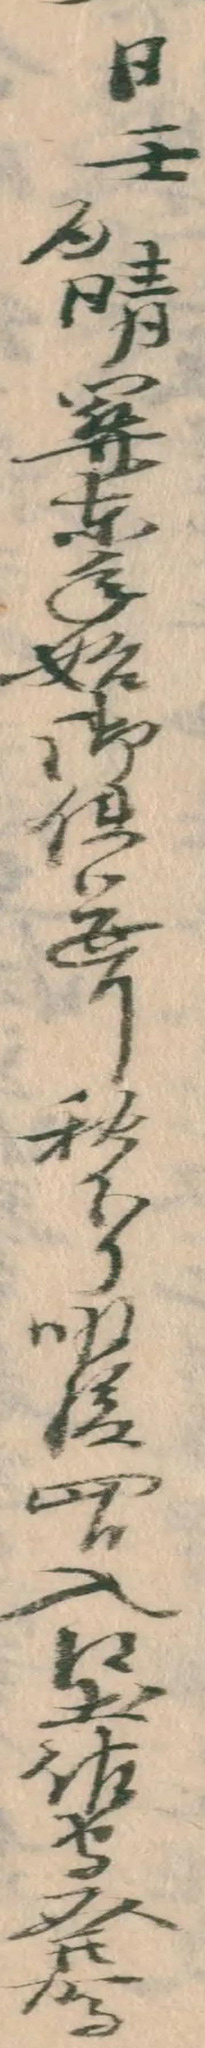二日壬酉晴開東年始御使御返り秋下り明後四日入江出佐守発駕
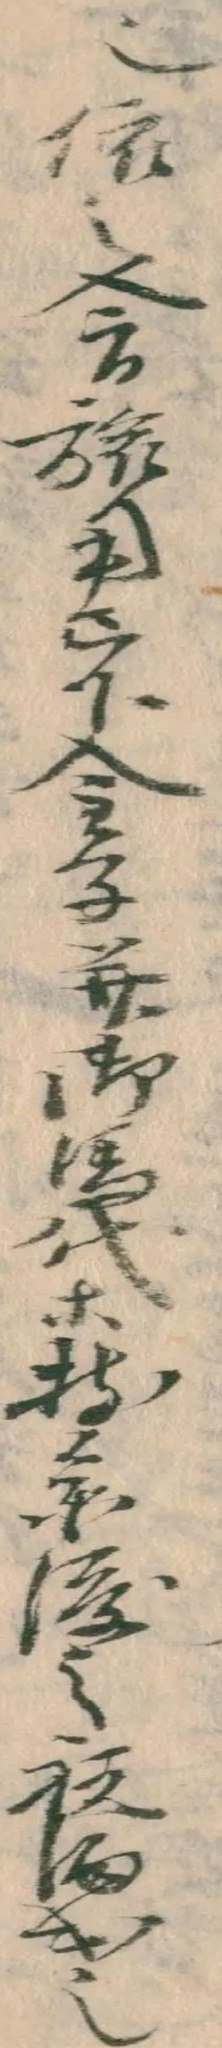也依之今日旅用已下金子幷御馬代等持参渡之祝酒出也
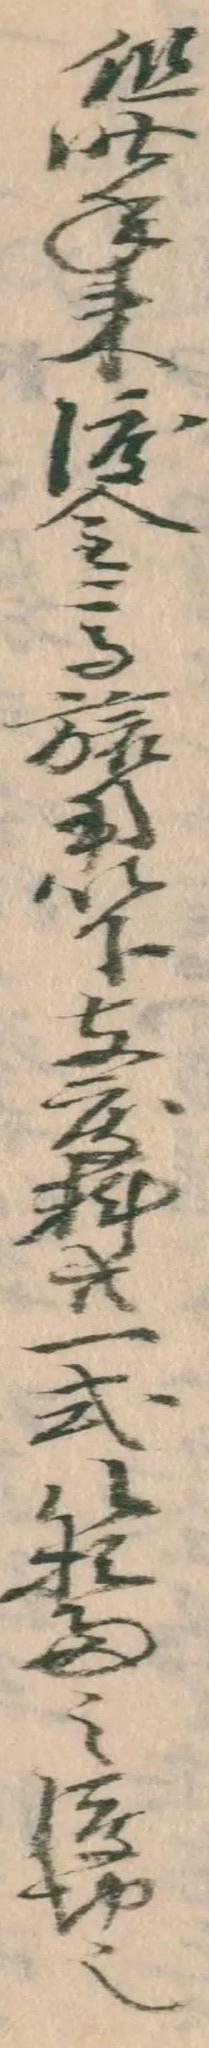但昨年来渡金高旅用以下支度料共一式八拾両之渡切也
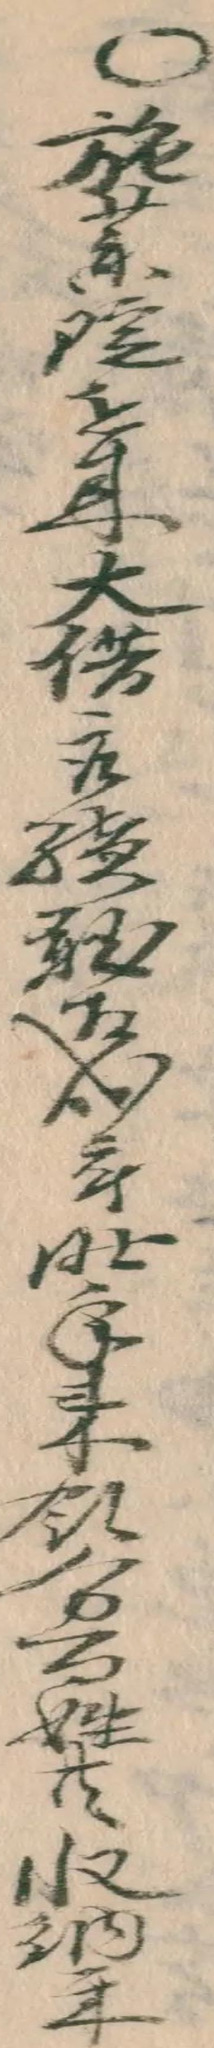〇施薬院近来大借取續難相成ニ付昨年来領分百姓共収納年
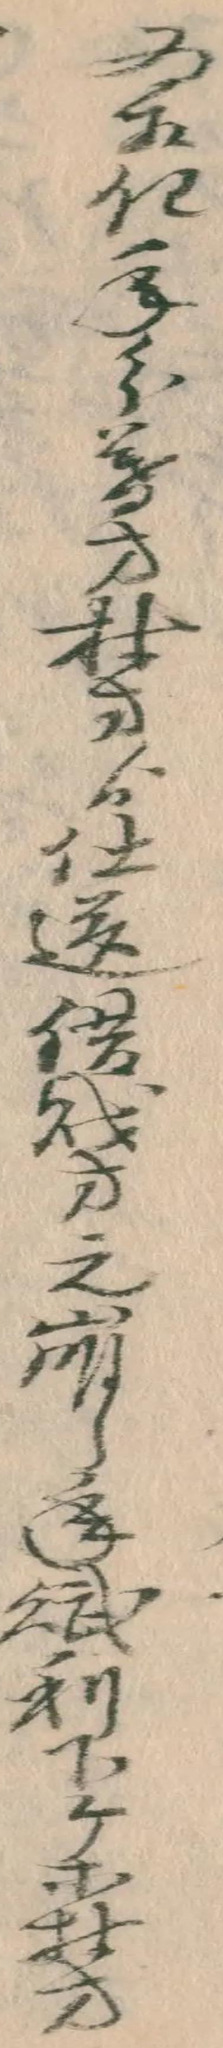為相任年分暮方村方ゟ仕送借財方之崩し年年賦利下ケ等村方
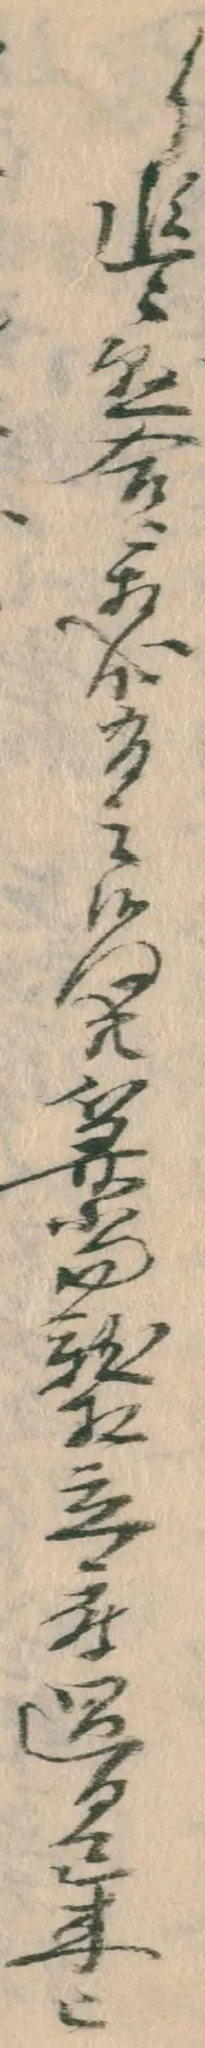より追々懸合ニ相成有之候得共算當難相立ニ付過日已来被
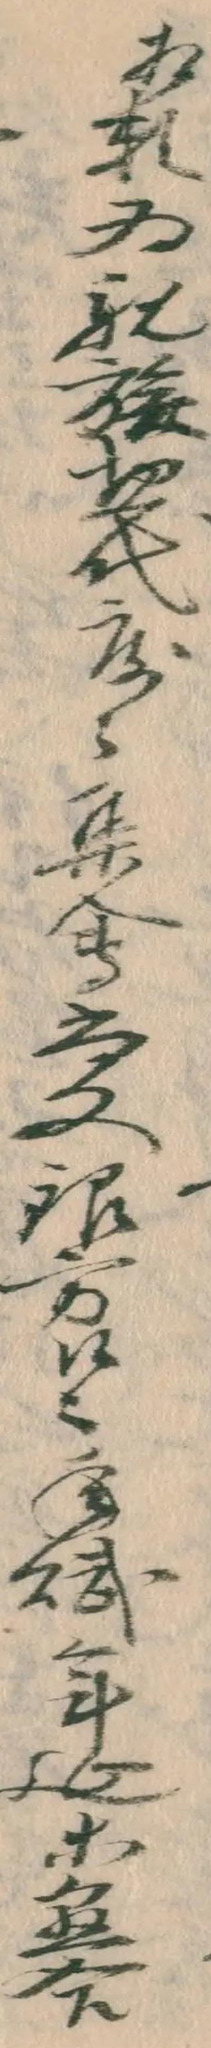相頼為親族惣代度々集會尚又銀方口々年賦年延等懸合
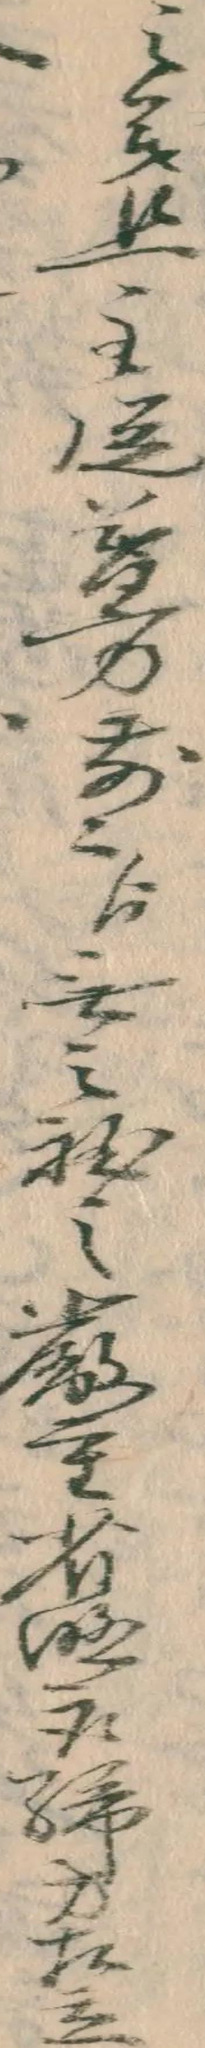之義且主送暮方前々ゟ無之程之厳重省略取締方相立
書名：賀茂社記録. 第69冊
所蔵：国立国会図書館 National Diet Library, JAPAN
